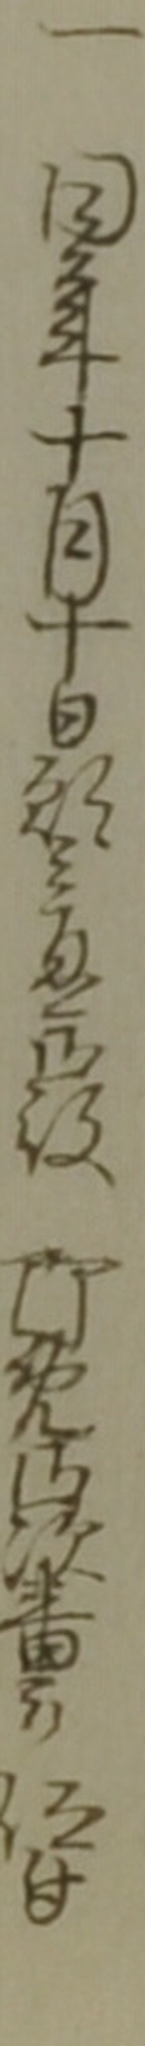一同年十月十日願之通御改御免御次番被仰付
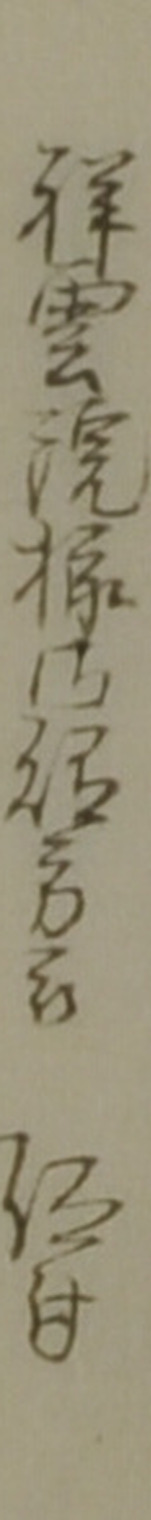祥雲院様御賄方被仰付
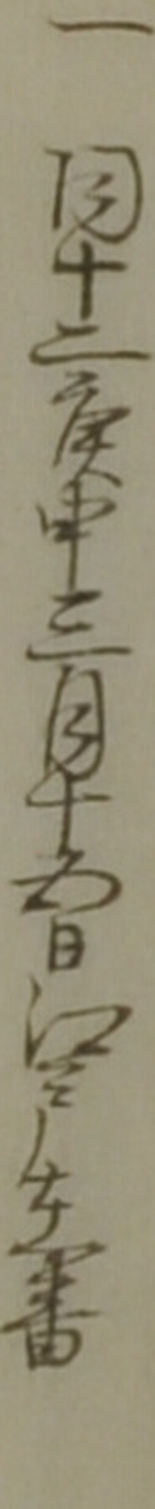一同十二庚申三月十五日江戸在番
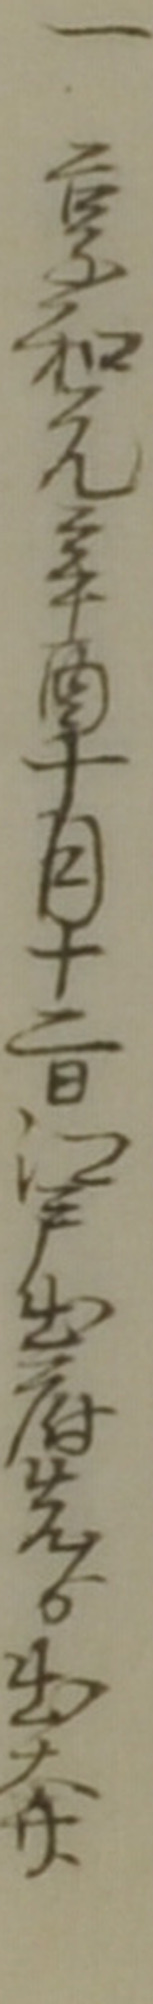一享和元辛酉十月十二日江戸出府先ゟ出奔
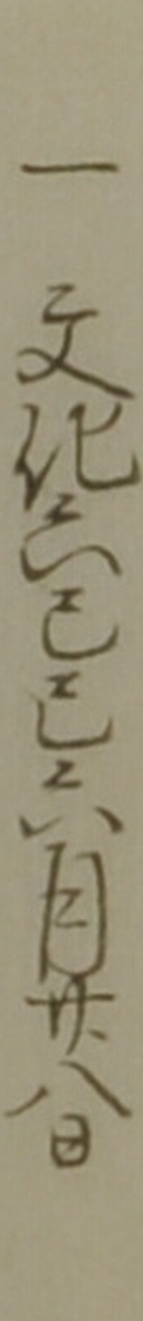一文化六己巳六月廿八日
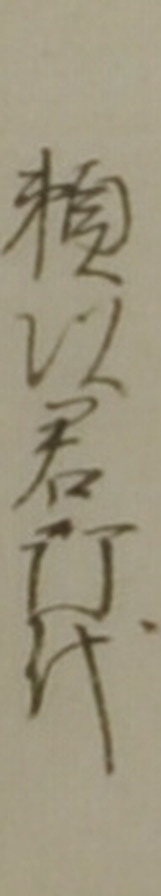頼以君御代

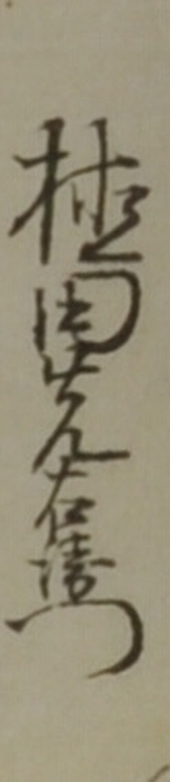植田先右衛門
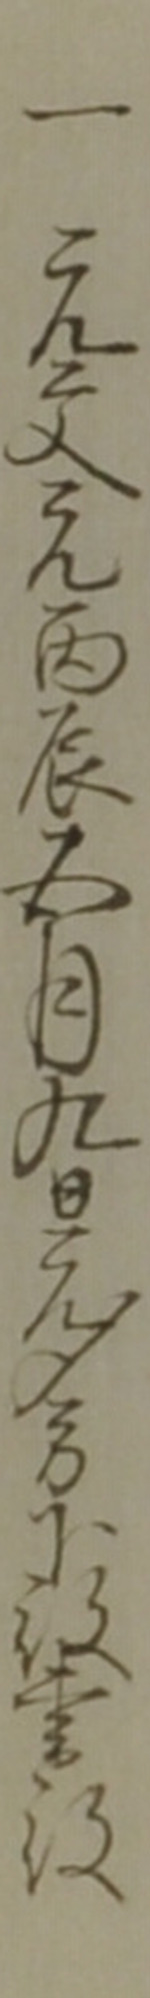一元文元丙辰五月九日元〆方下役書役
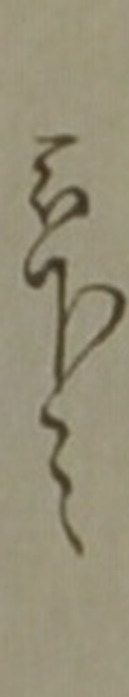被下之
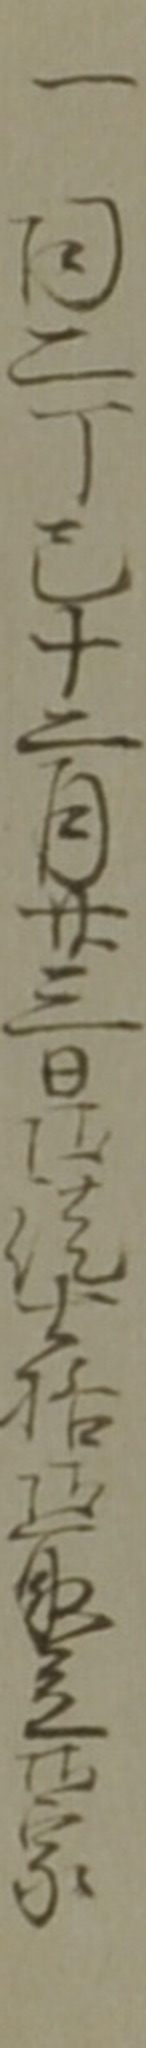一同二丁巳十二月廿三日御徒士格御取立御家
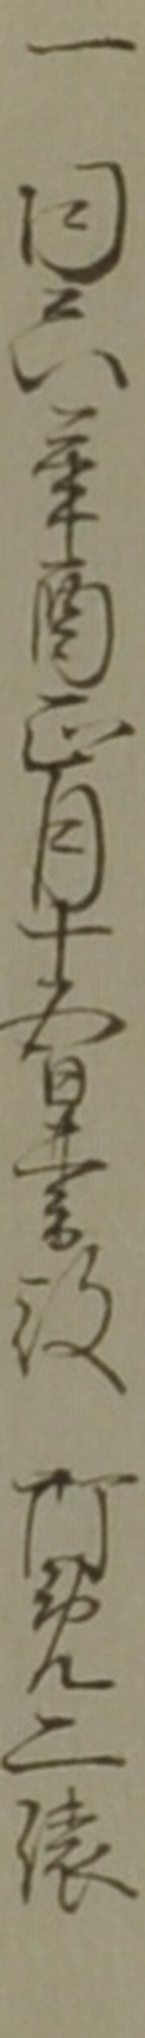一同六辛酉正月十五日書役御免二俵
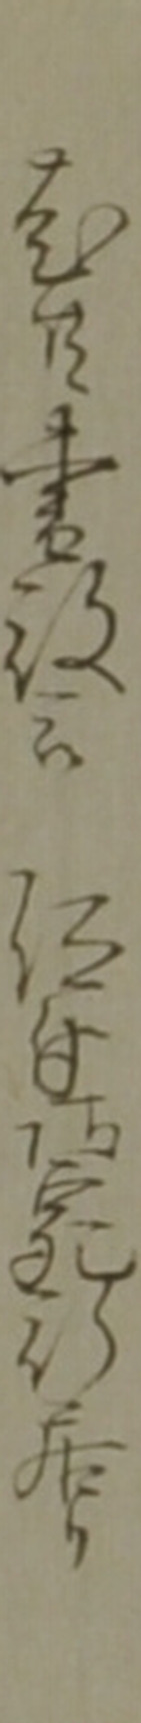老共書役被仰付御宛行居リ
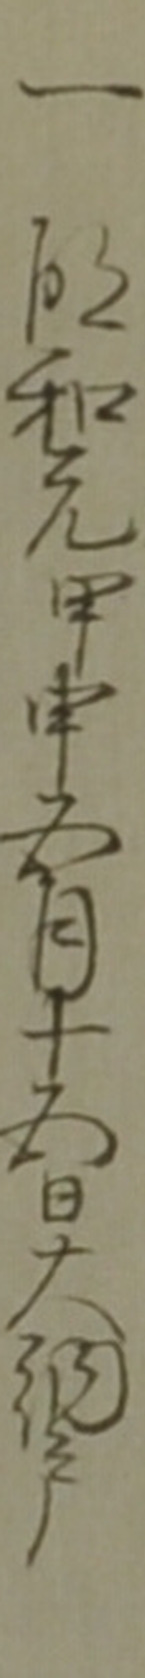一明和元甲申五月十五日大納戸
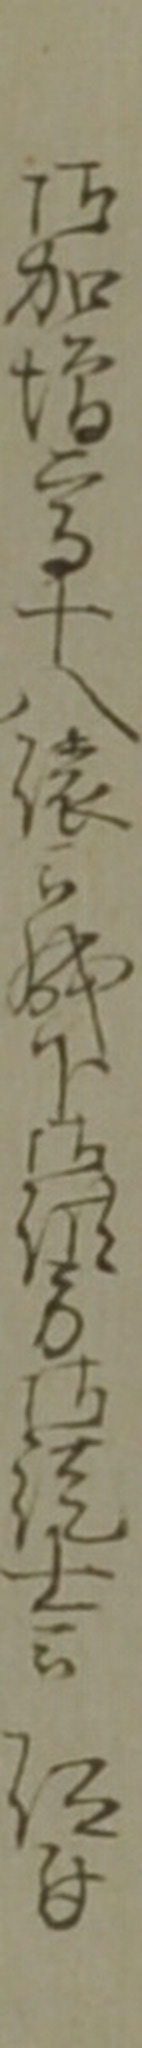御加増高十八俵被成下御供方御徒士被仰付
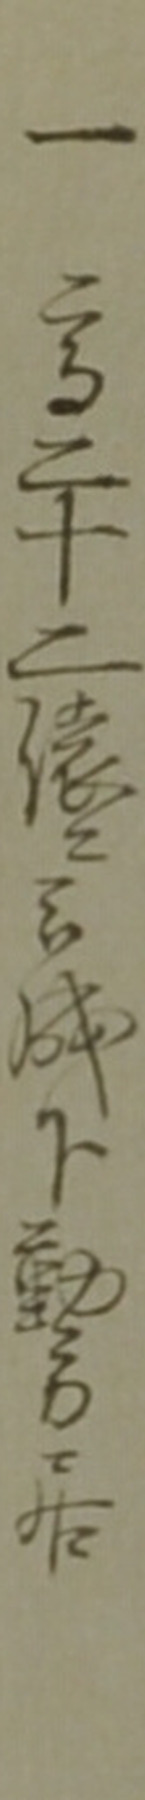一高二十二俵ニ而被成下勤方居
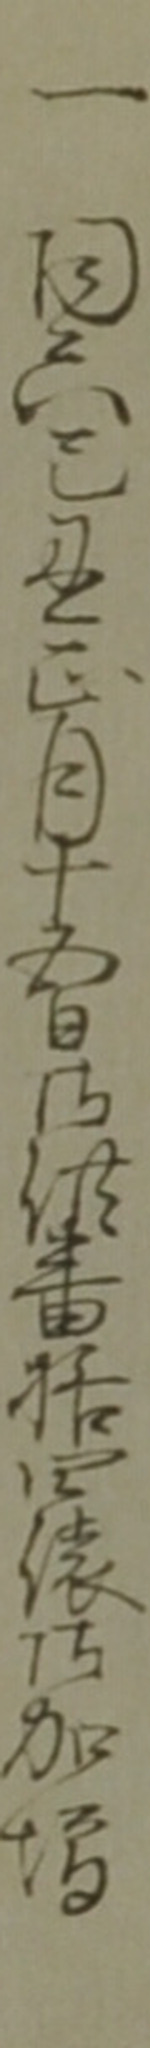一同六己丑正月十五日御供番格四俵御加増
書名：無足廃家（壱）
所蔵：伊那市立高遠町図書館・合同会社AMANE
